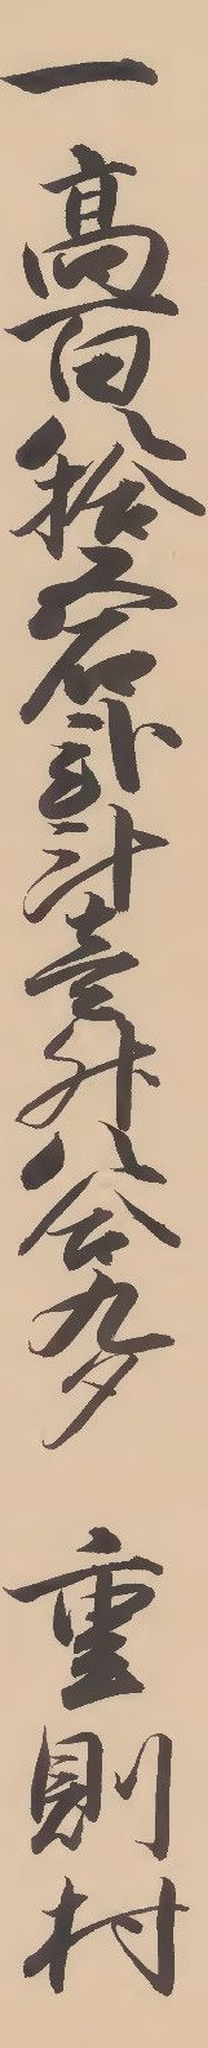一高百八拾五石弐斗壱升八合九勺重則村
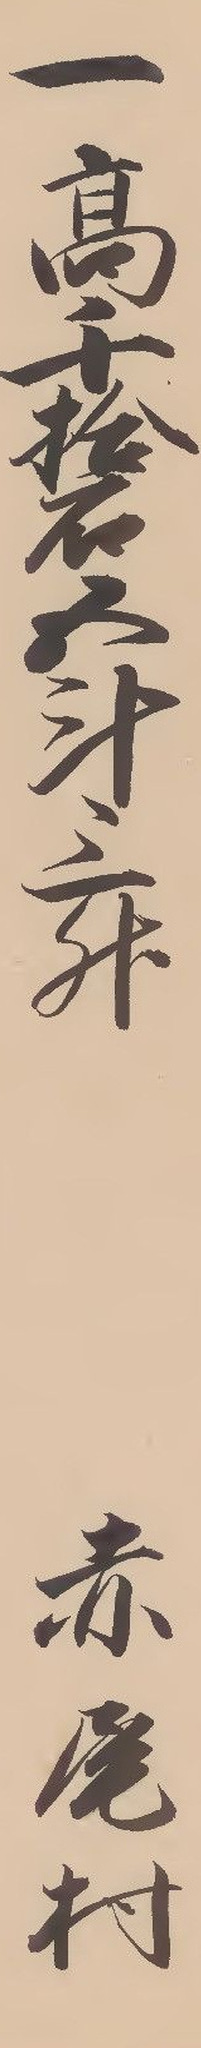一高千拾石五斗三升赤尾村
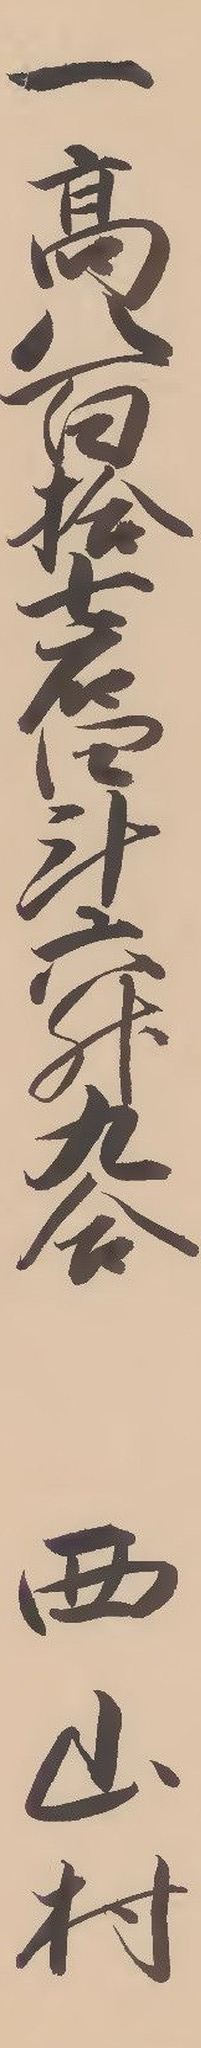一高八百拾七石四斗六升九合西山村

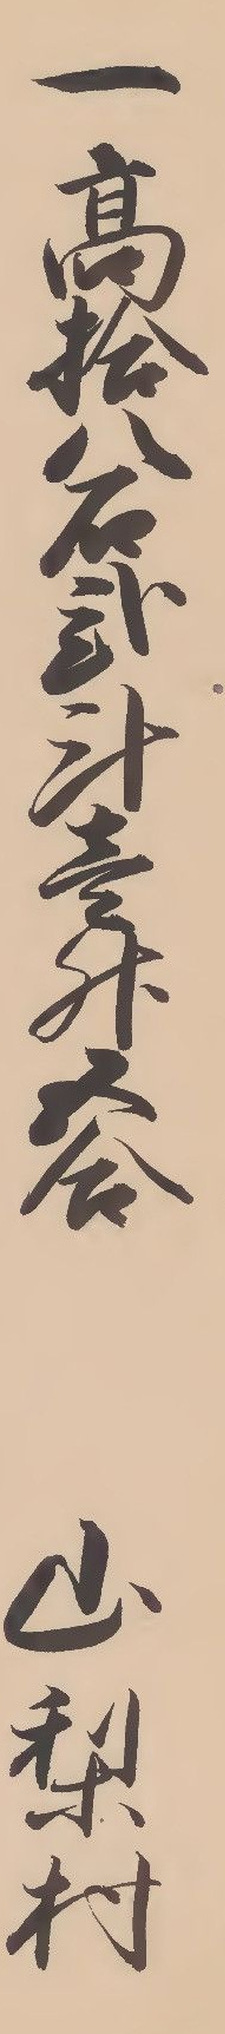一高拾八石弐斗壱升五合山梨村
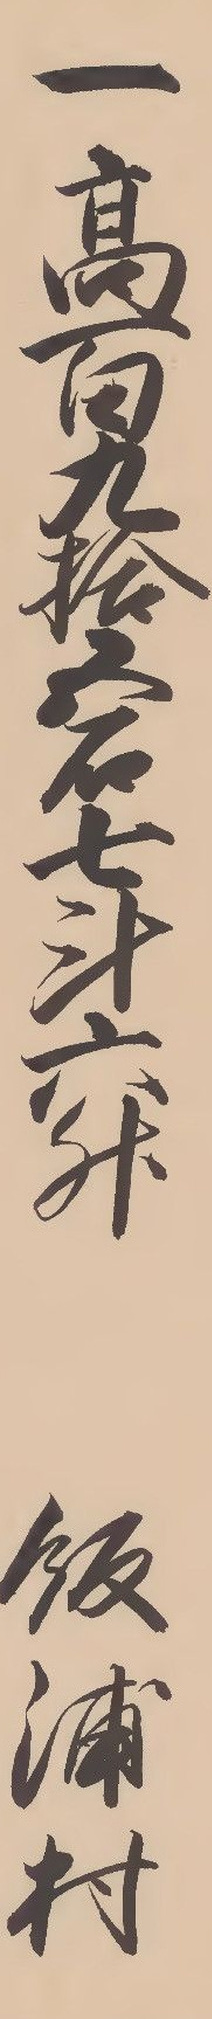一高百九拾五石七斗六升飯浦村
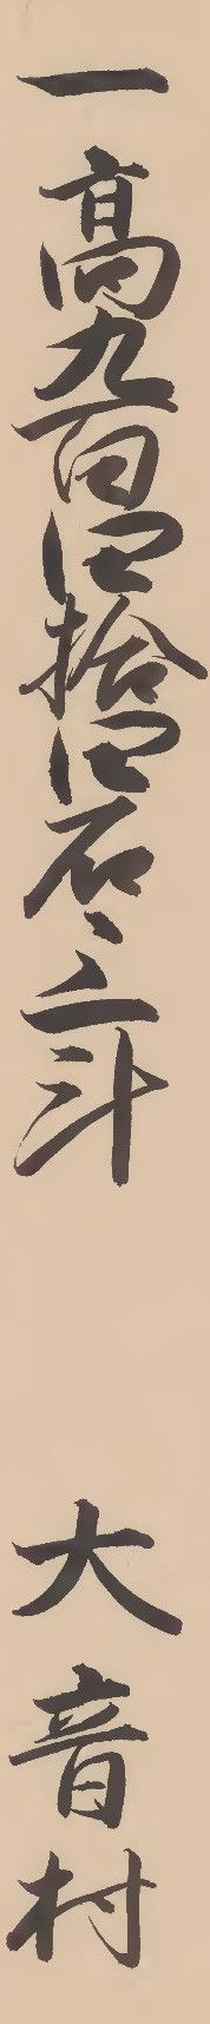一高九百四拾四石三斗大音村
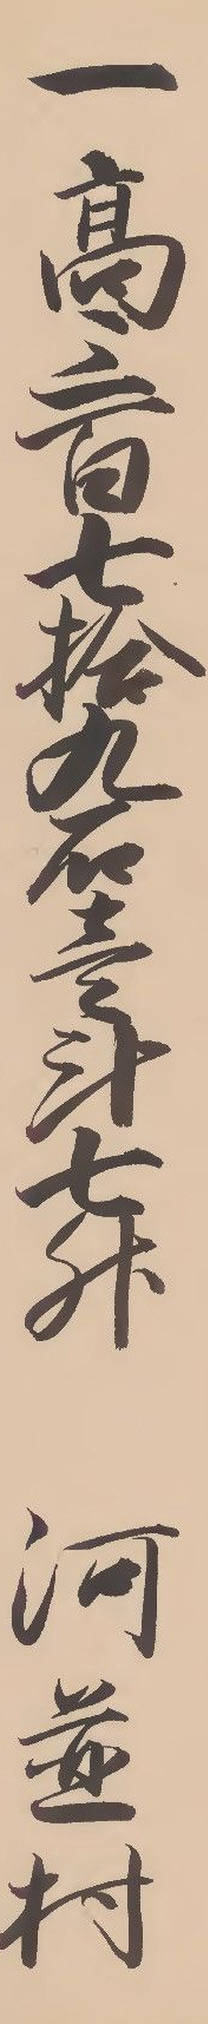一高三百七拾九石壱斗七升河並村
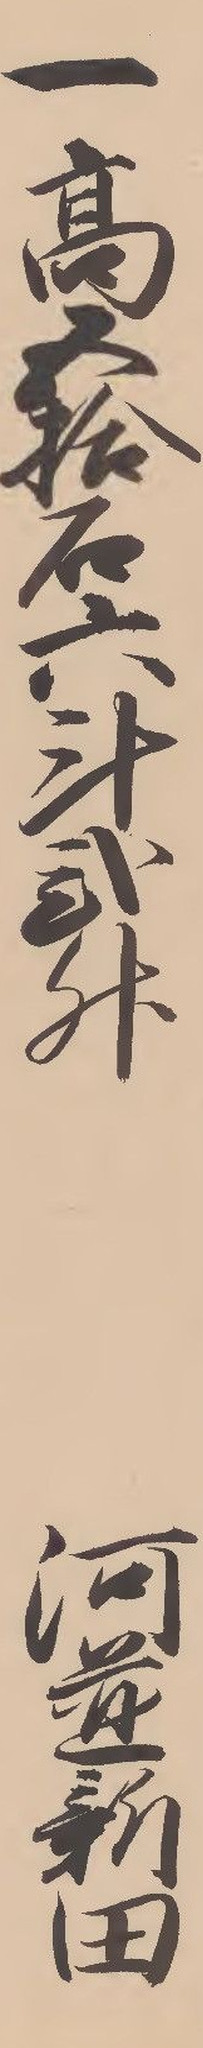一高五拾石六斗弐升河並新田
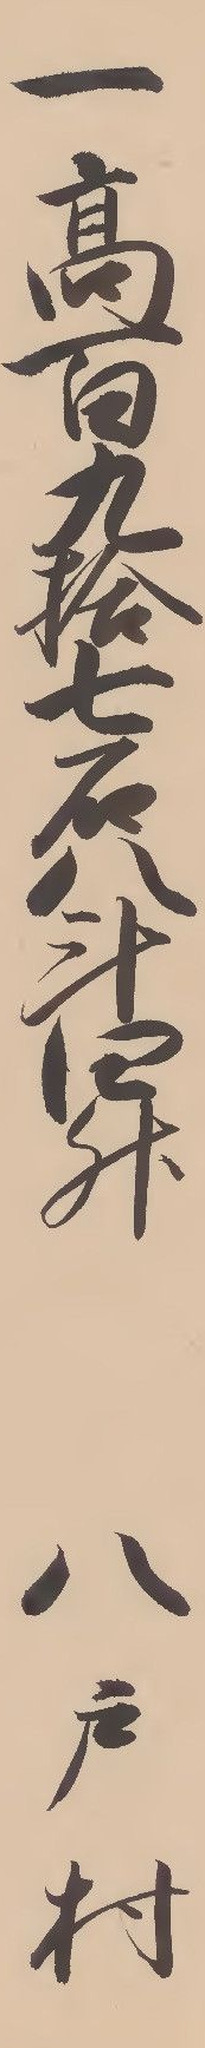一高百九拾七石八斗四升八戸村
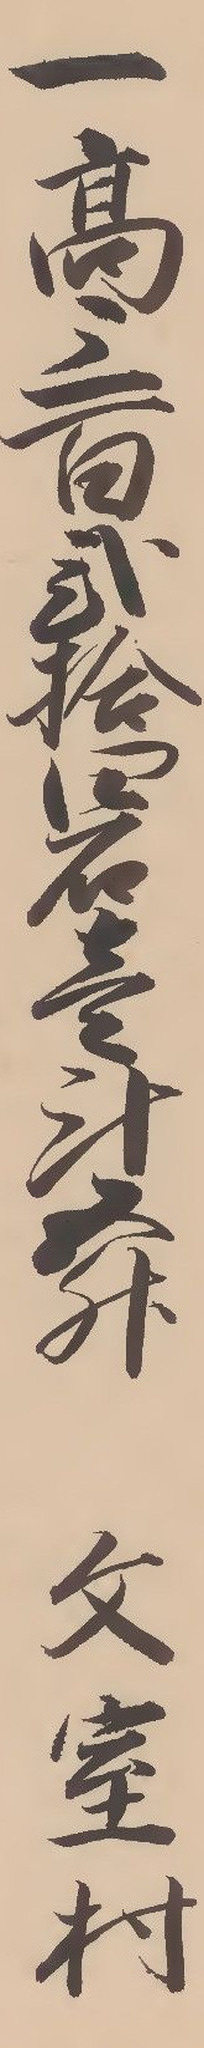一高三百弐拾四石壱斗五升文室村
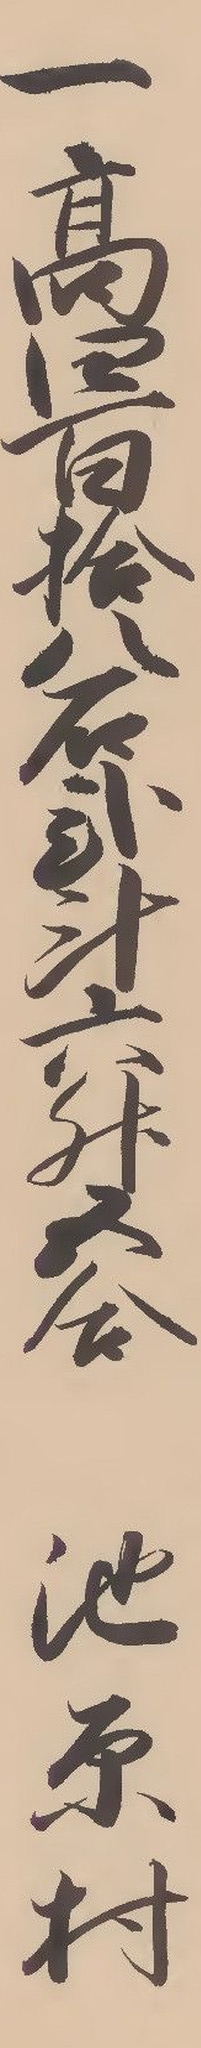一高四百拾八石弐斗六升五合池原村

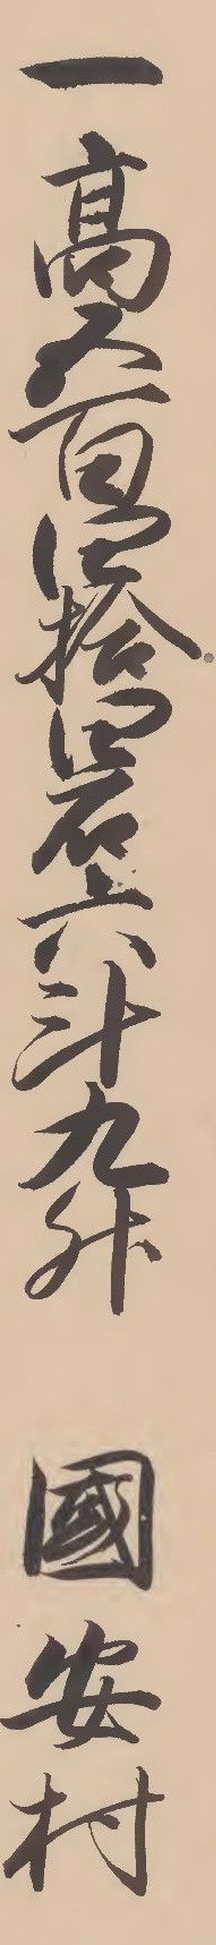一高五百四拾四石六斗九升国安村
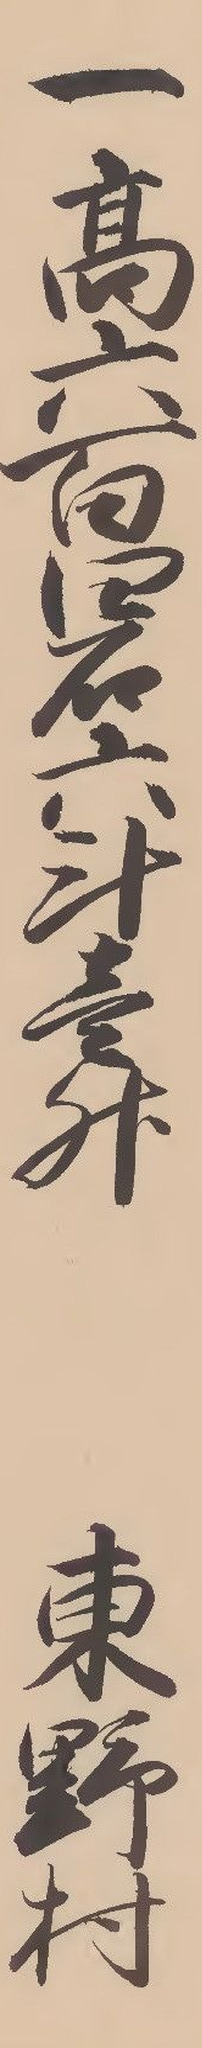一高六百四石六斗壱升東野村
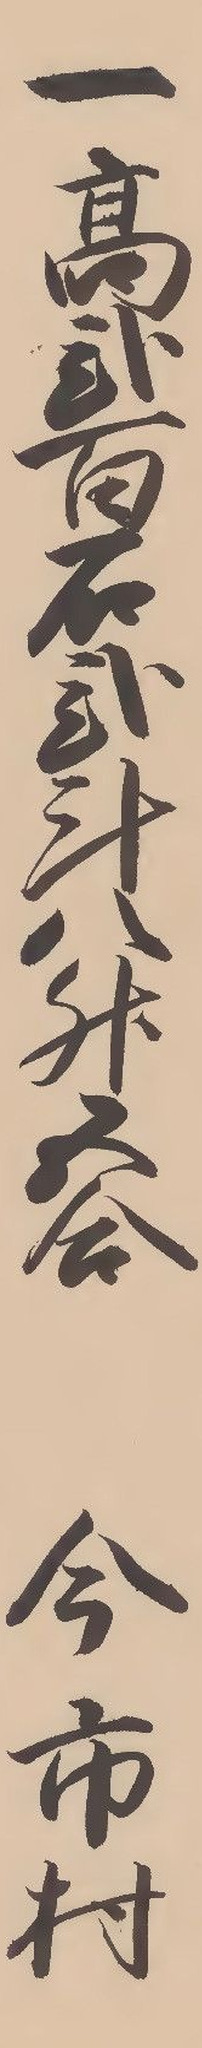一高弐百石弐斗八升五合今市村
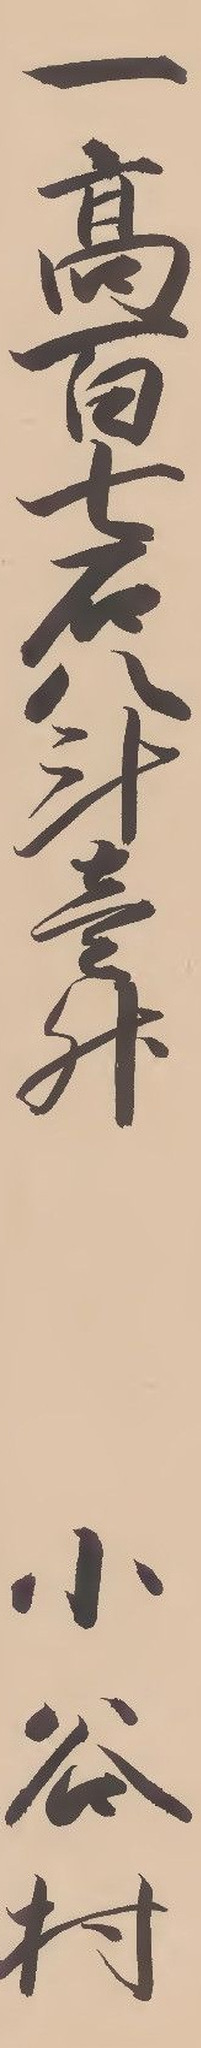一高百七石八斗壱升小谷村
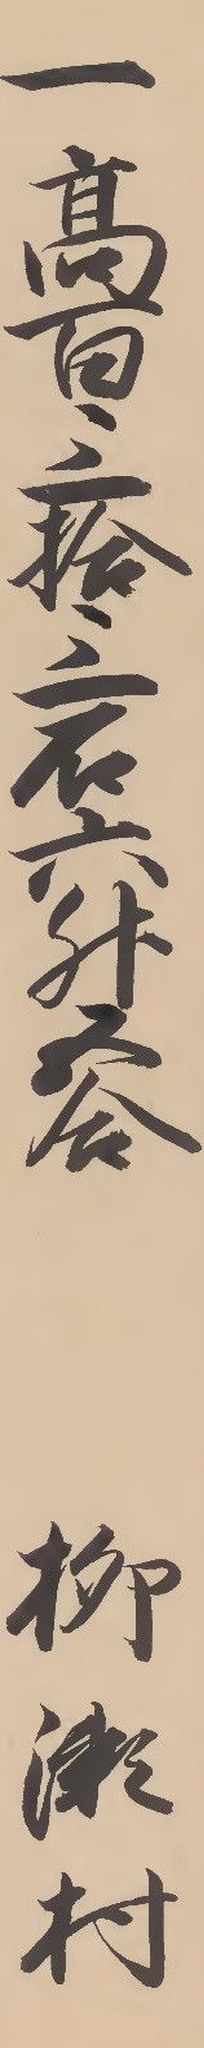一高百三拾三石六升五合柳瀬村
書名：近江国郷帳
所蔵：国立公文書館 National Archives of Japan
